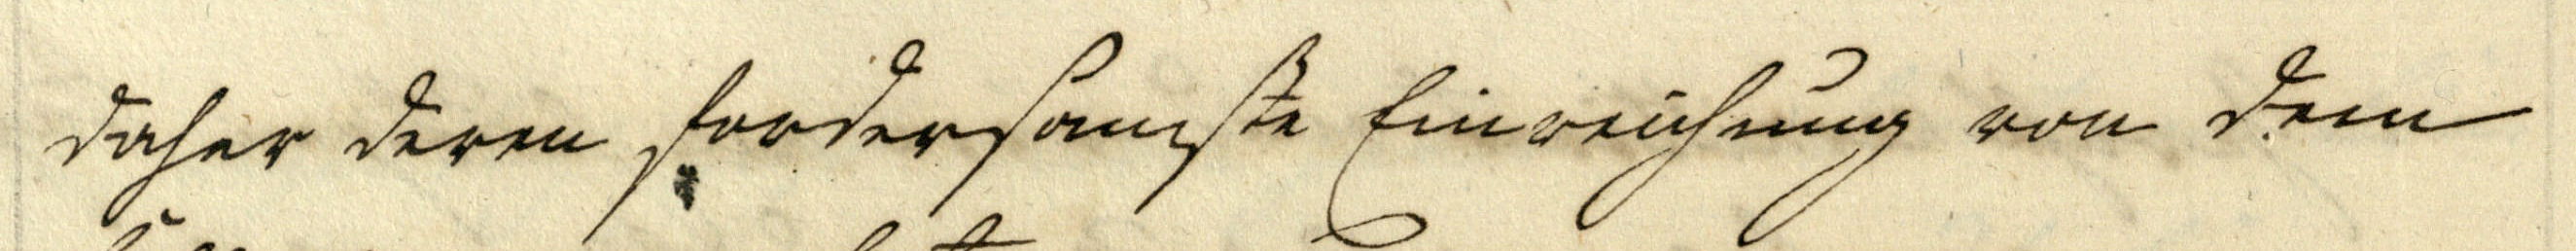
daher deren fordersamste Einreichung von dem
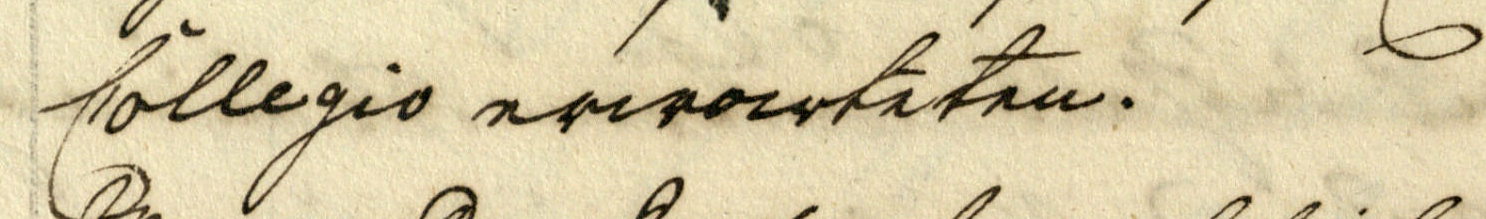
Collegio erwarteten.
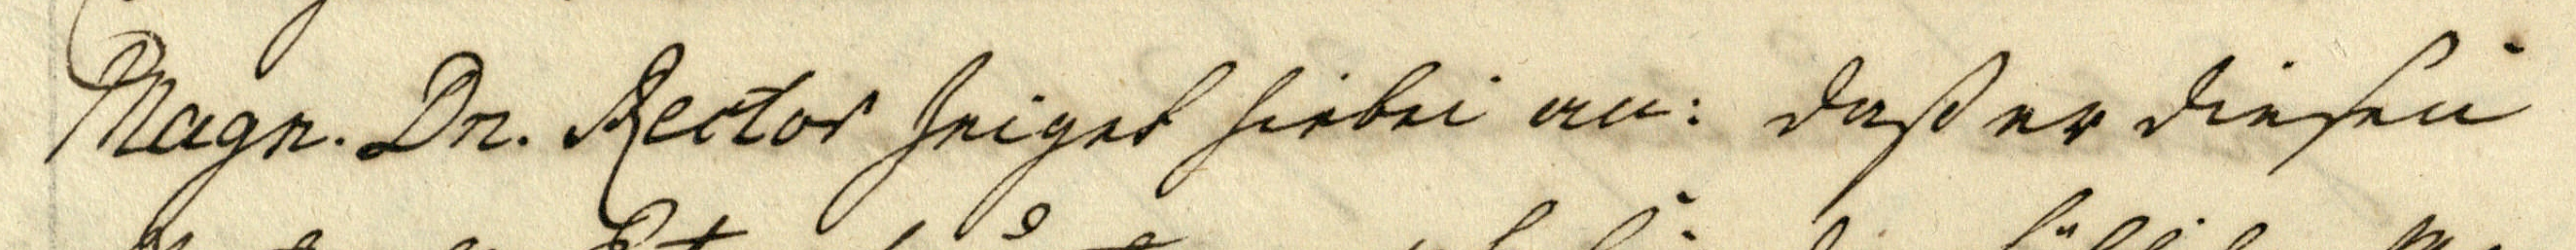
Magn. Dn. Rector zeiget hiebei an: daß er diesen
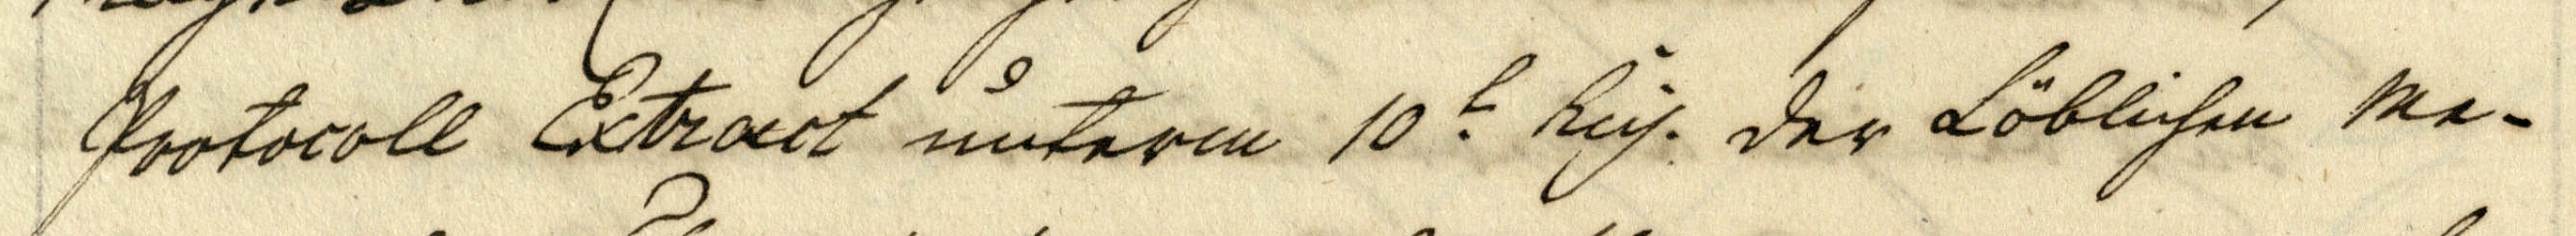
Protocoll Extract unterm 10ten huj. der Löblichen Me-
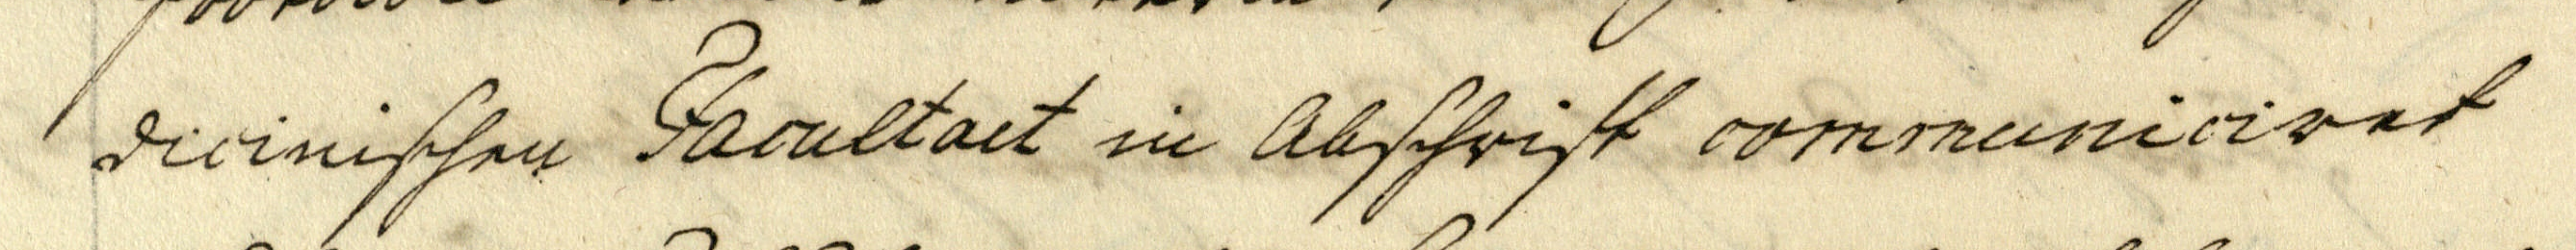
dicinischen Facultaet in Abschrift communiciret
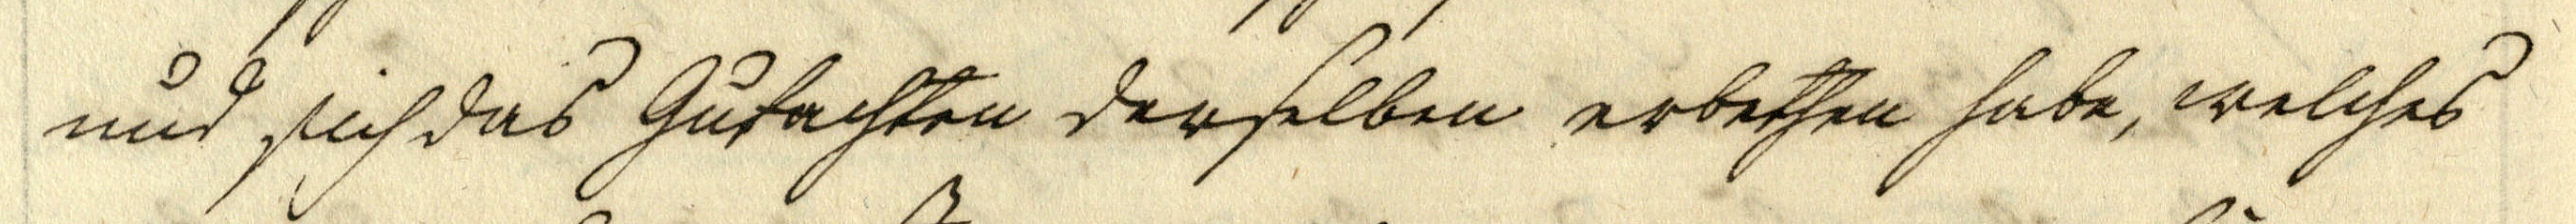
und sich das Gutachten derselben erbethen habe, welches
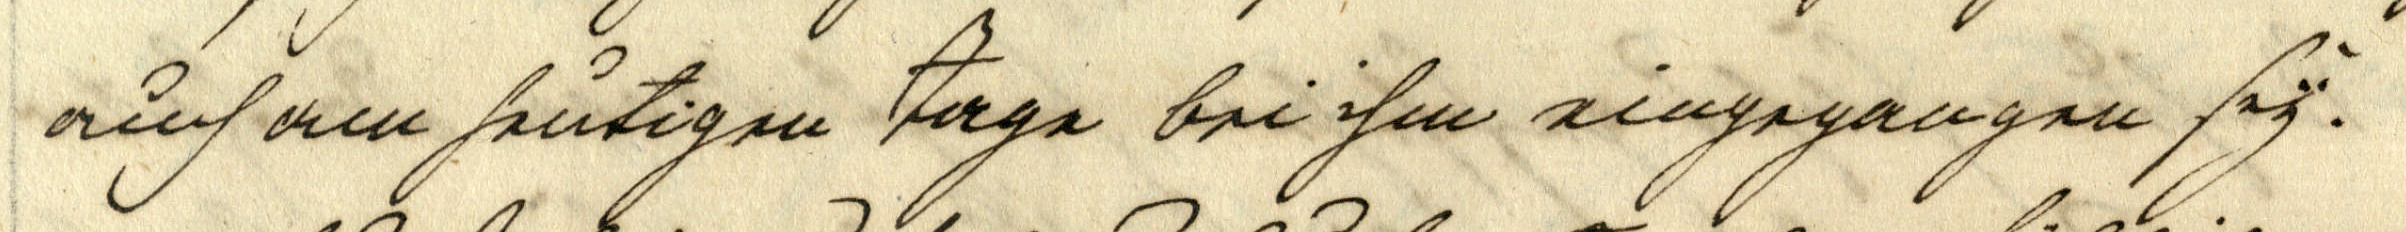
auch am heutigen Tage bei ihm eingegangen sey.
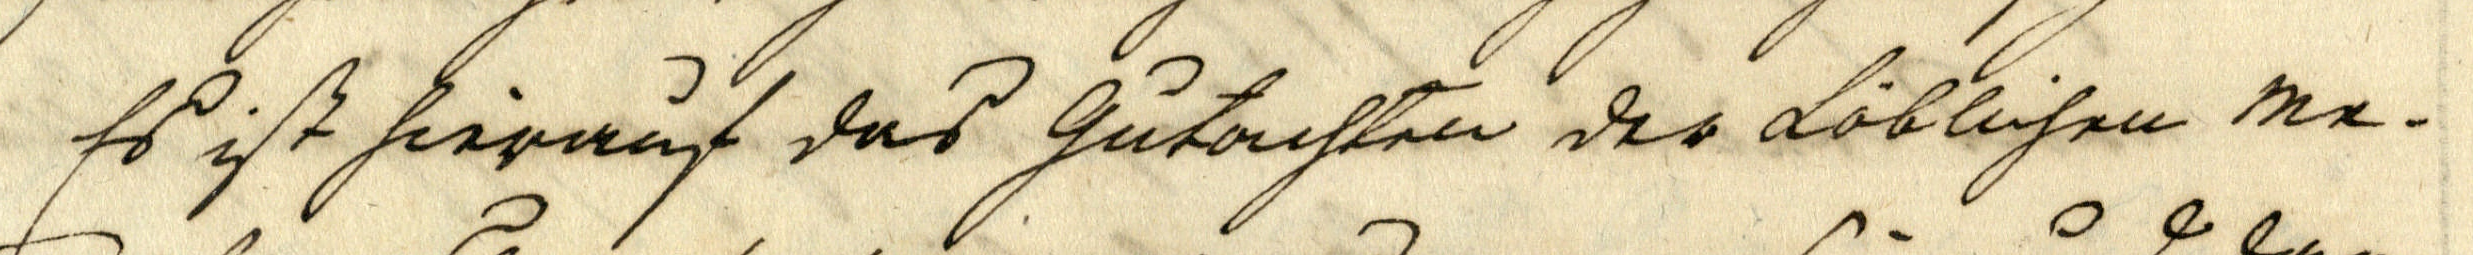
Es ist hierauf das Gutachten der Löblichen Me-
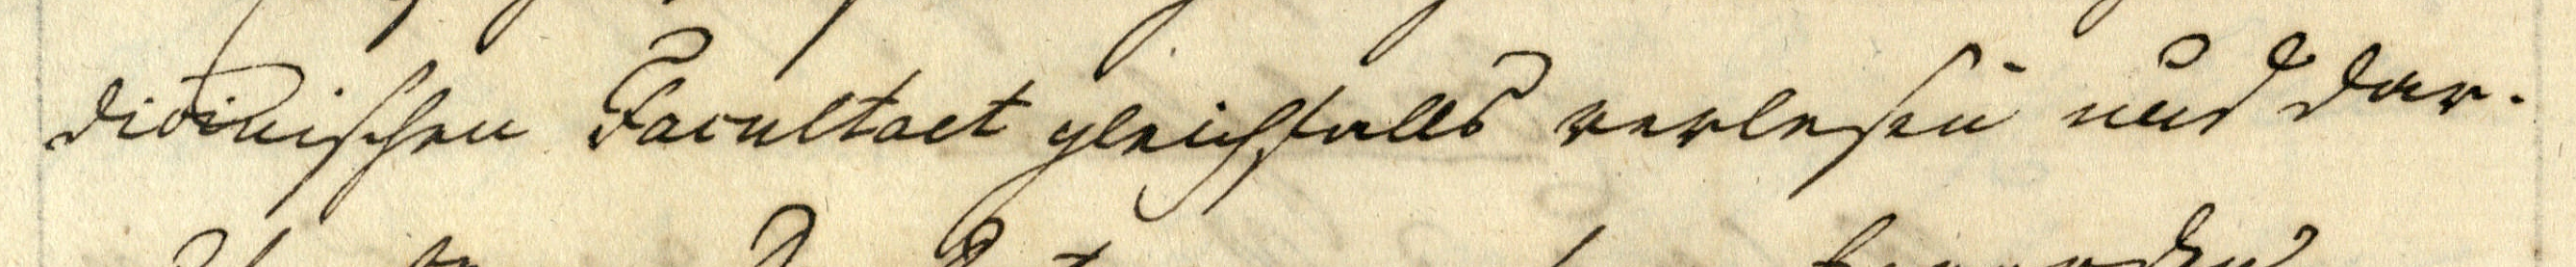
dicinischen Facultaet gleichfalls verlesen und dar-
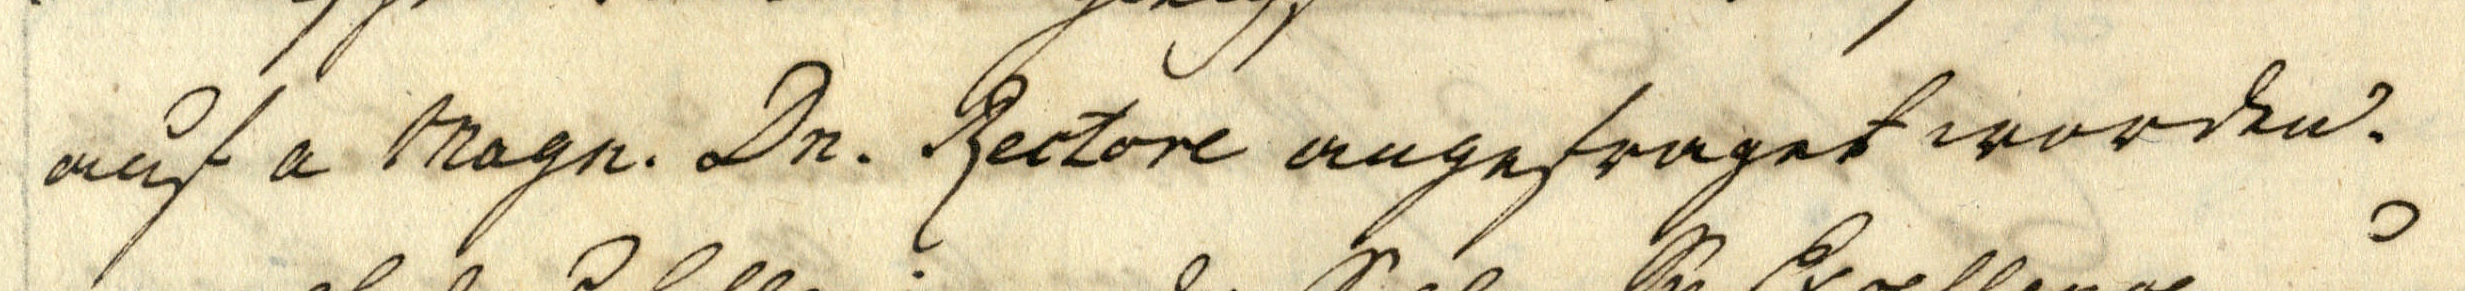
auf a Magn. Dn. Rectore angefraget worden.
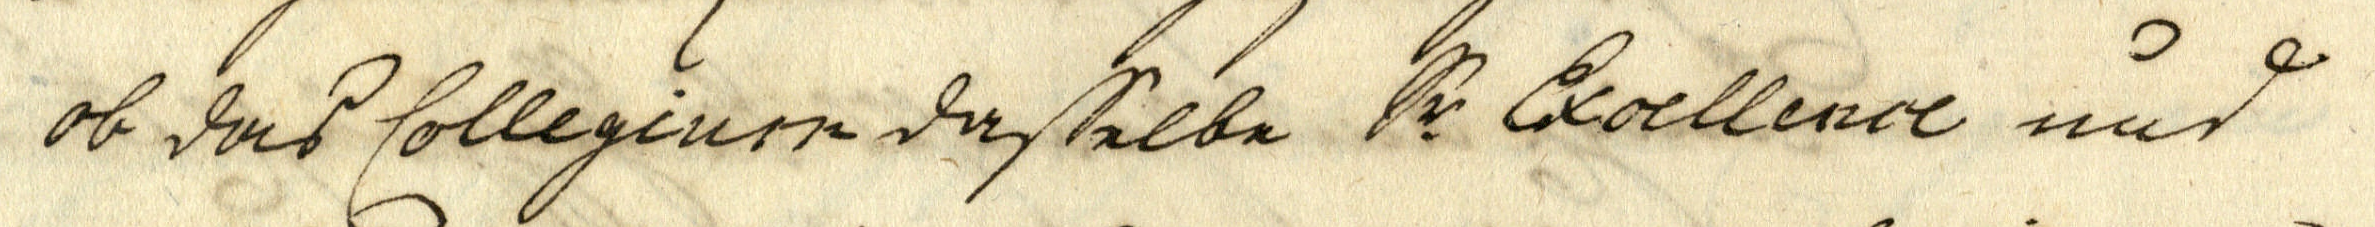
ob das Collegium dasselbe Sr. Excellence und
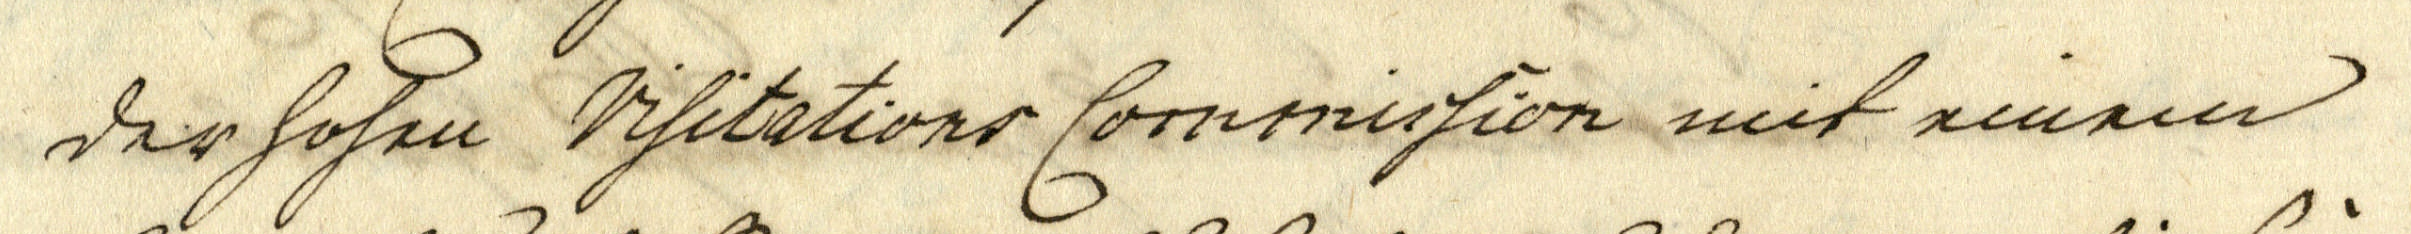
der hohen Visitations Commission mit einem
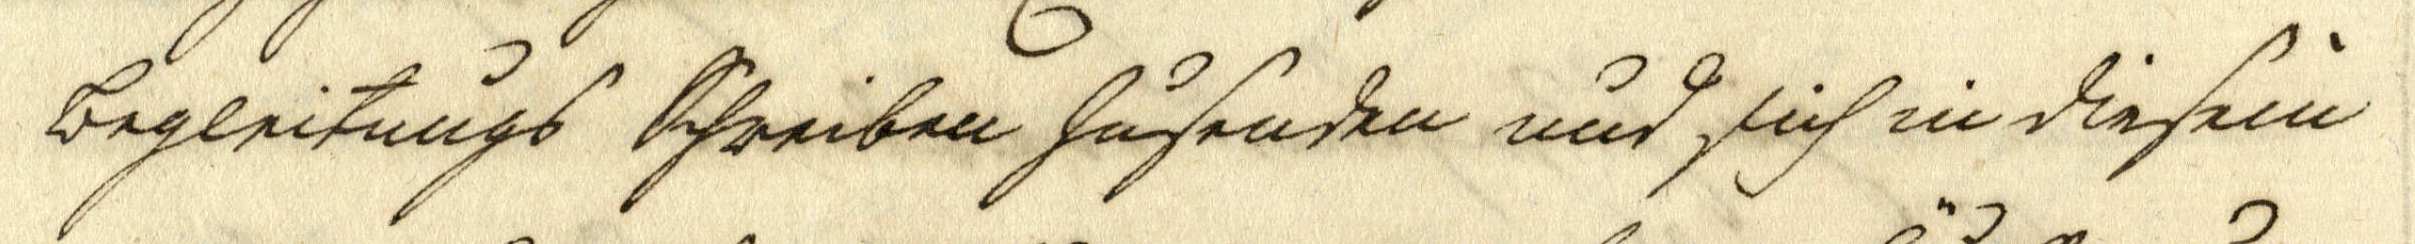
Begleitungs Schreiben zusenden und sich in diesem
